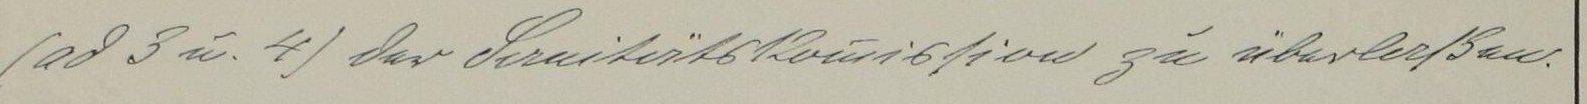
(ad 3 u. 4) der Sanitätskommission zu überlaßen.
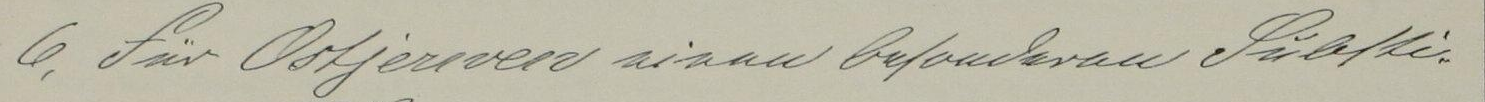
6. Für Ostjerwen einen besonderen Substi-
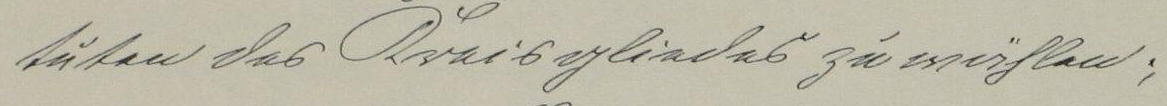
tuten des Kreisgliedes zu wählen;
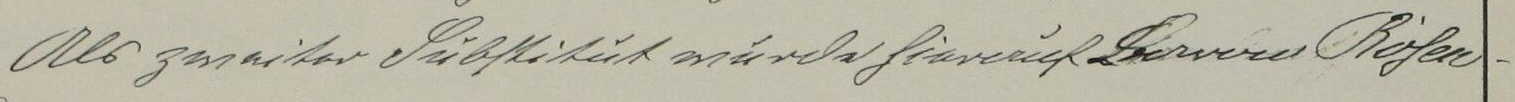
Als zweiter Substitut wurde hierauf Baron Rosen-
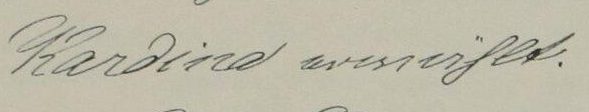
Kardina erwählt.
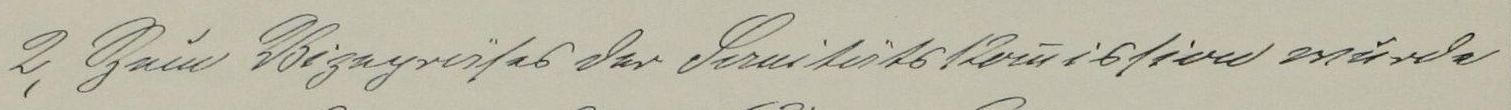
2. Zum Vizepräses der Sanitätskommission wurde
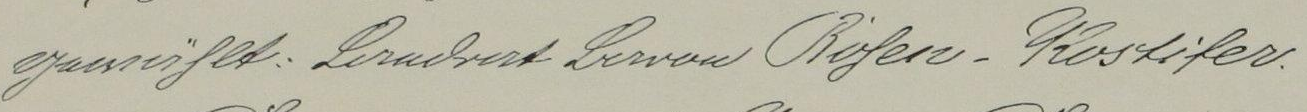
gewählt: Landrat Baron Rosen-Kostifer.
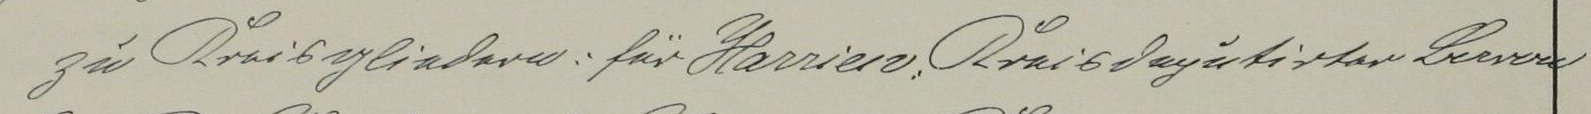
zu Kreisgliedern: für Harrien: Kreisdeputierter Baron
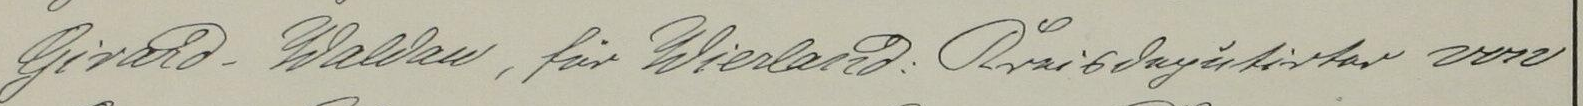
Girard-Waldau, für Wierland: Kreisdeputierter von
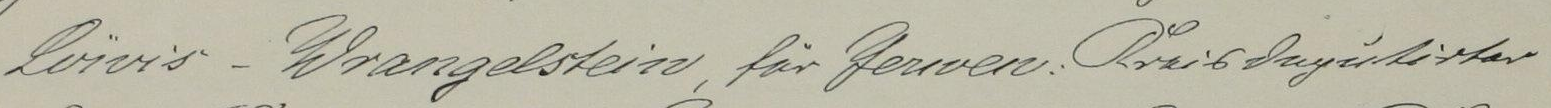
Löwis-Wrangelstein, für Jerwen: Kreisdeputierter
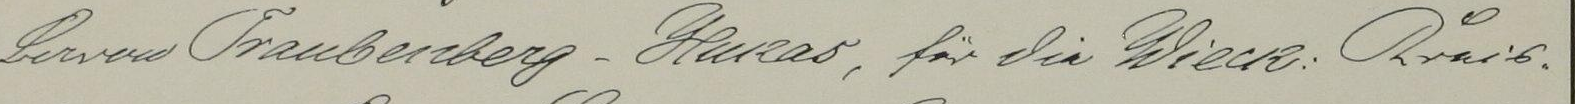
Baron Traubenberg-Hukas, für die Wieck: Kreis-
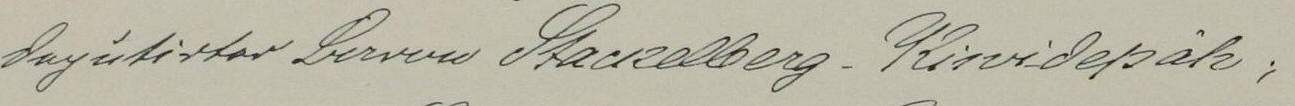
deputierter Baron Stackelberg-Kiwidepäh;
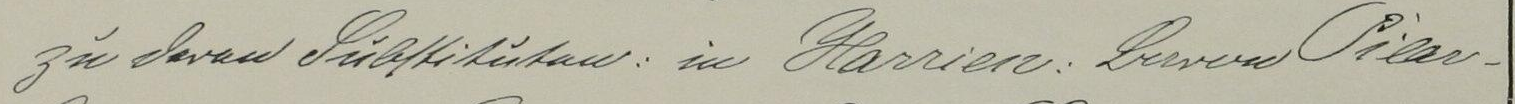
zu deren Substituten: in Harrien: Baron Pilar-
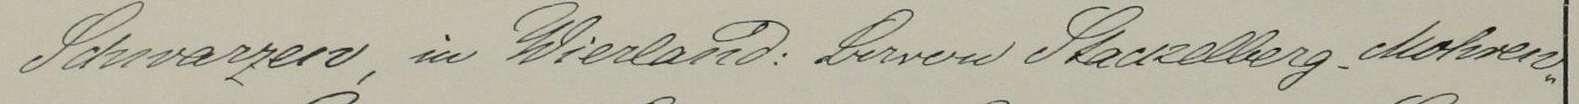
Schwarzen, in Wierland: Baron Stackelberg-Mohren-
